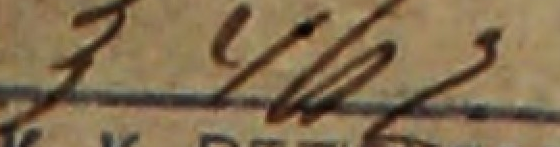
3462
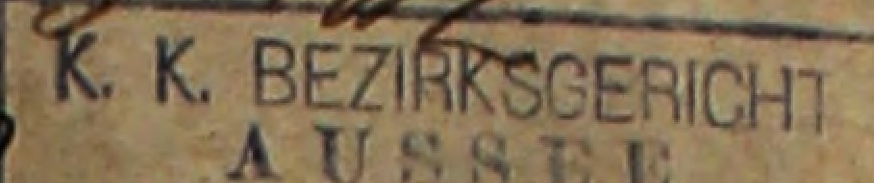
K. K. BEZIRKSGERICHT
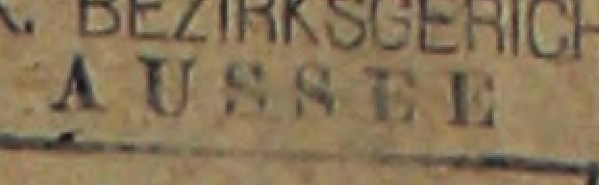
AUSSEE
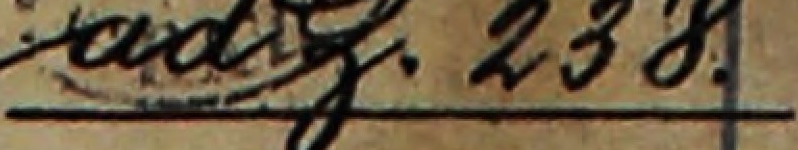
adig. 238.
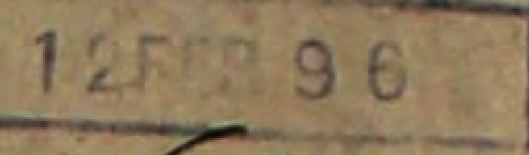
12 FEB. 96
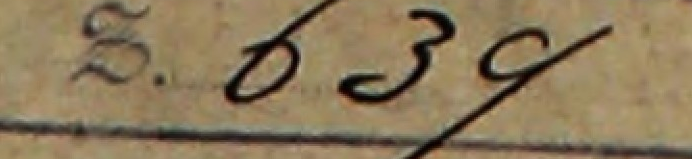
Z. 639
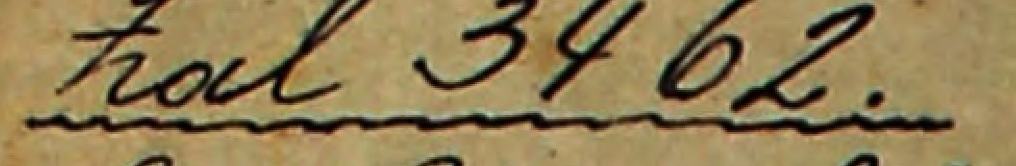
Zal 3462.
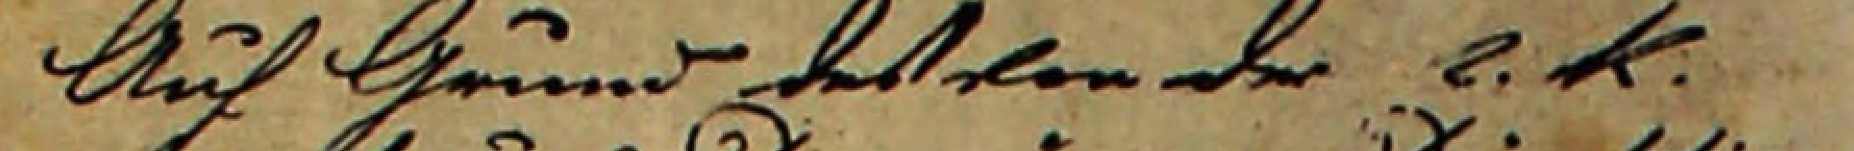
Auf Grund des von der k.k.
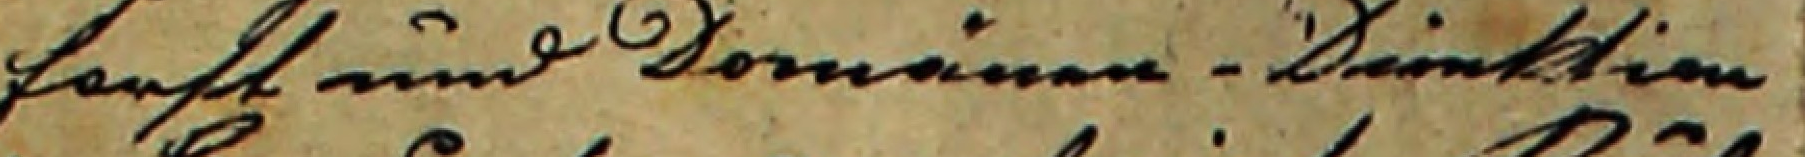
Forst und Domänen - Direktion
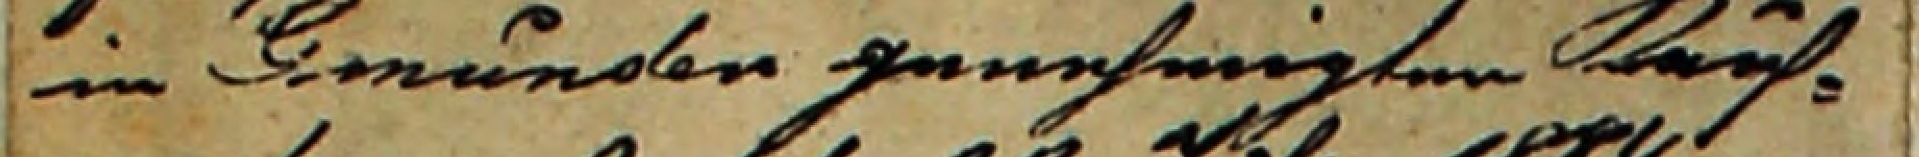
in Gmunden genehmigten Kauf=
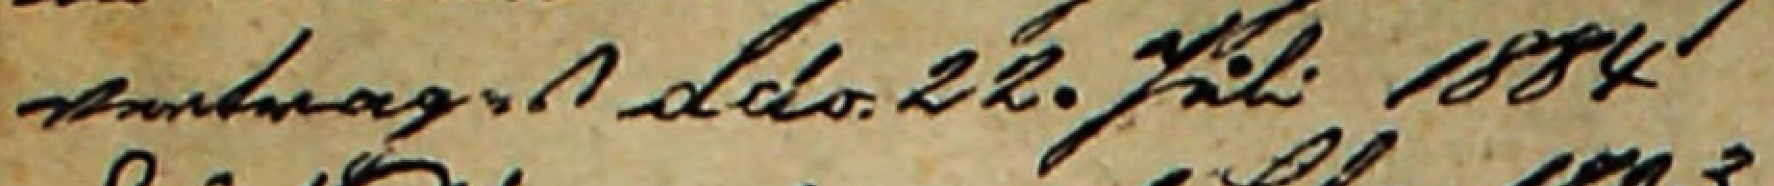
vertrages ddo. 22. Juli 1884
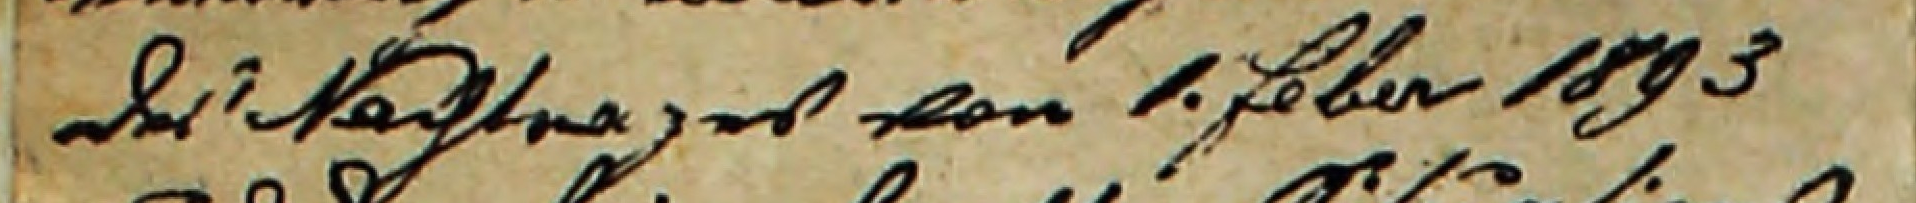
des ? Nachtrages von 1. Feber 1893
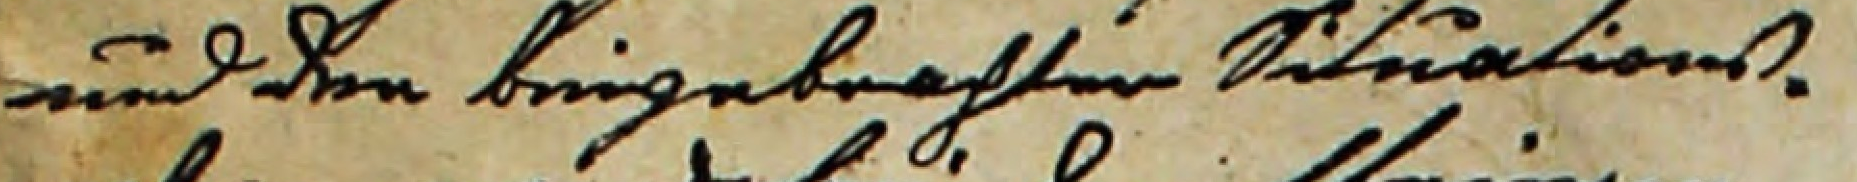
und den beigebrechten Situations=
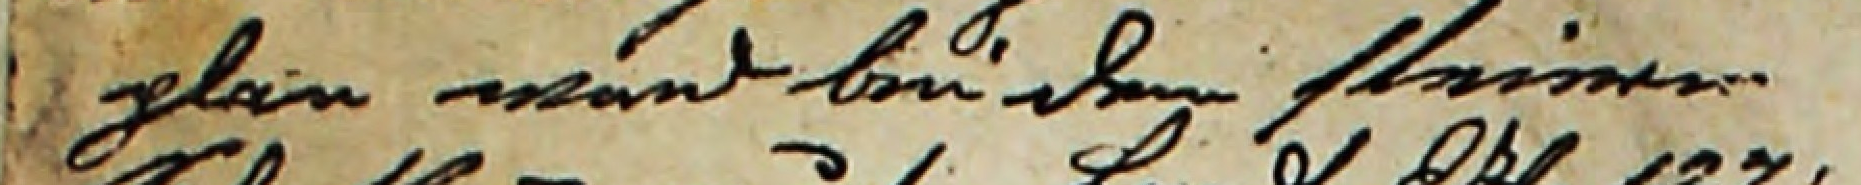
plan wand beiden steinen
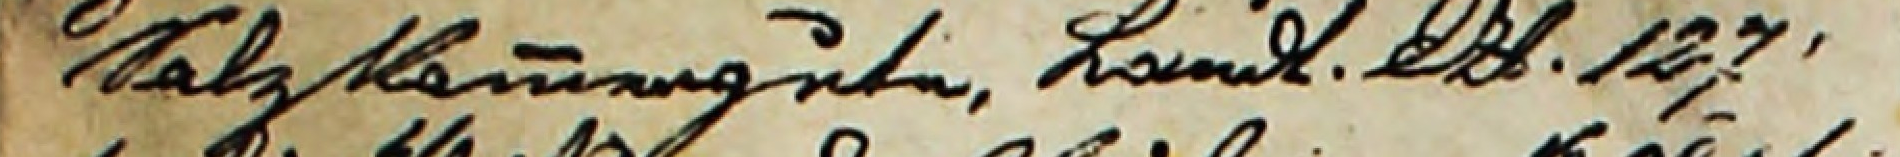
Salzkammergute, Landl. Ub. 127
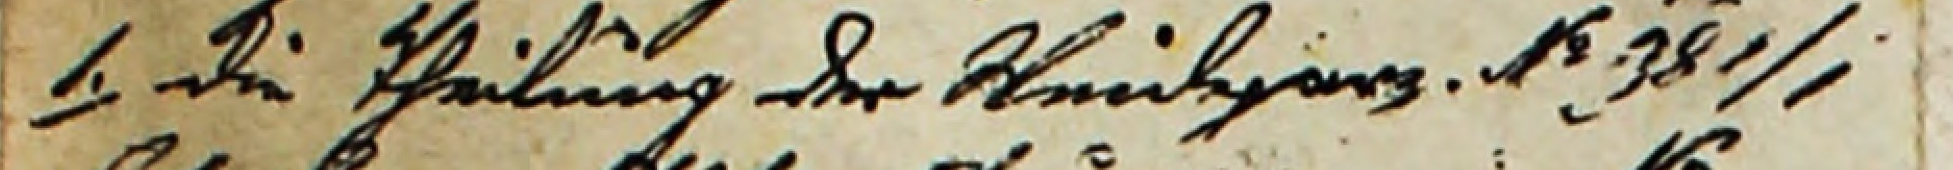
1. Die Theilung der Weidepars No 381/1
